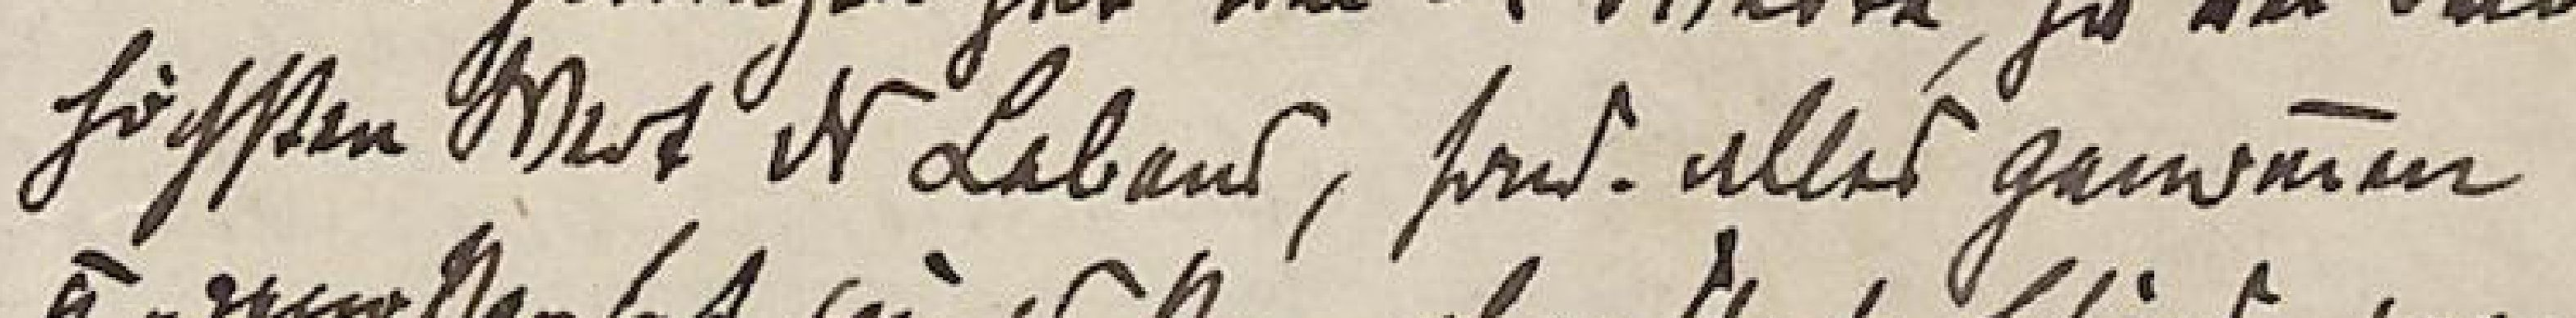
höchsten Wert des Leben, sond. alles gewonen
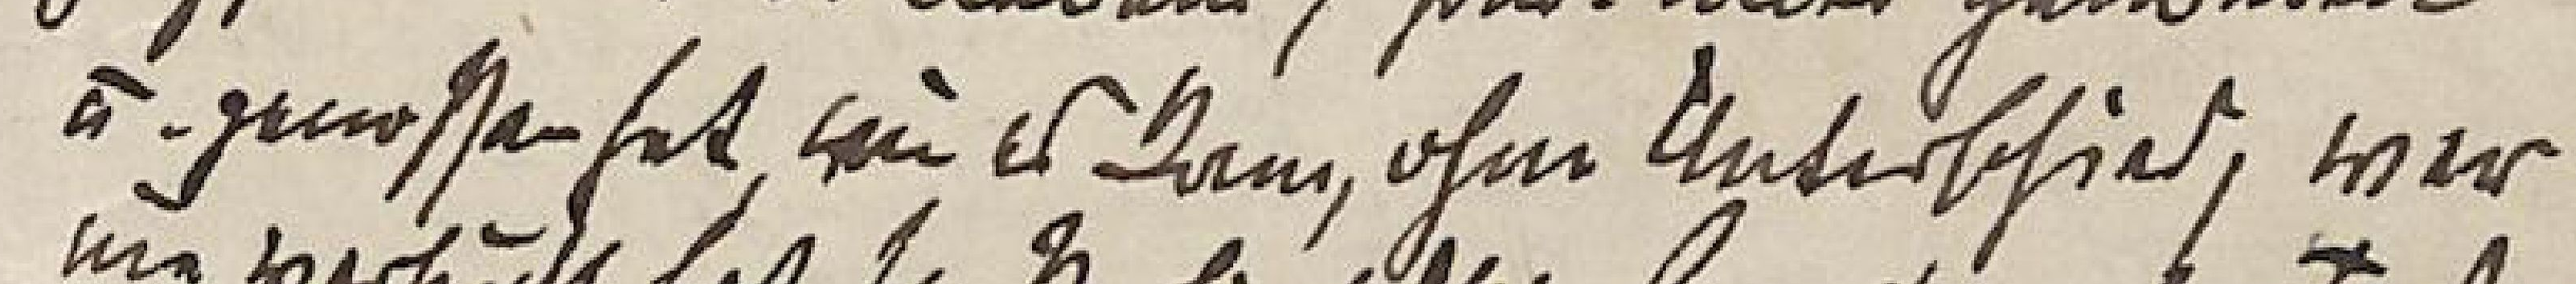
u. genossen hat, wie es kam, ohne Unterschied, wer
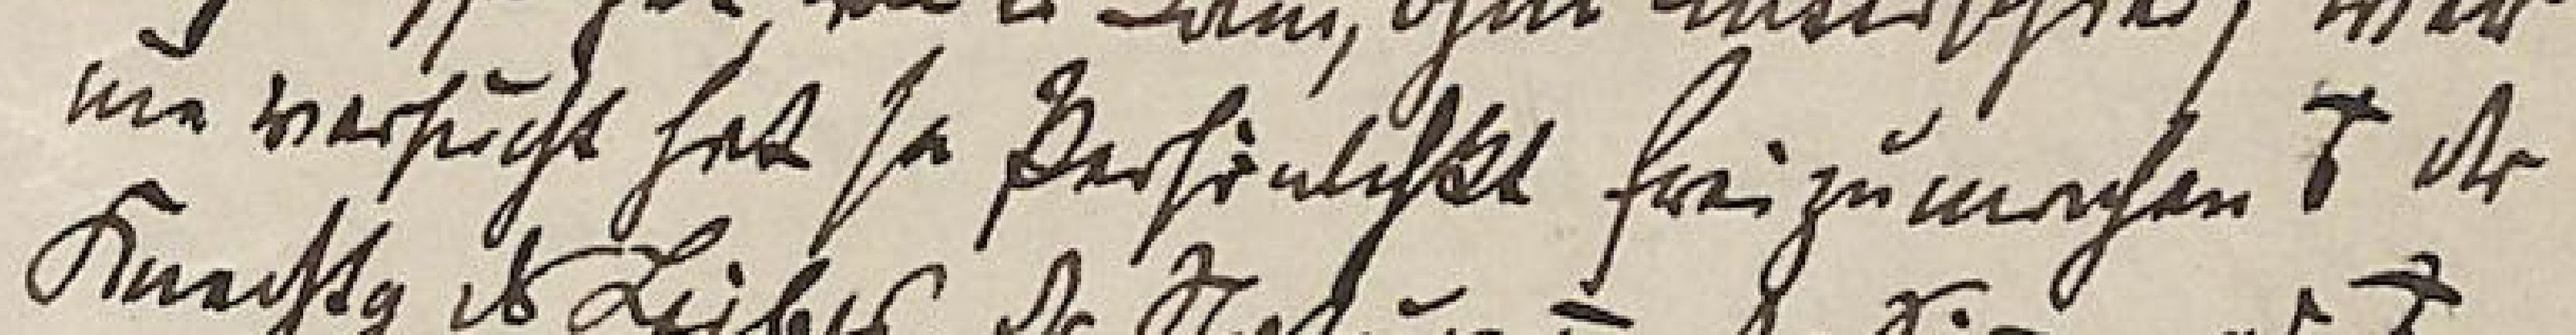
nie versucht hat sn Persönlichkt freizumachen s dr
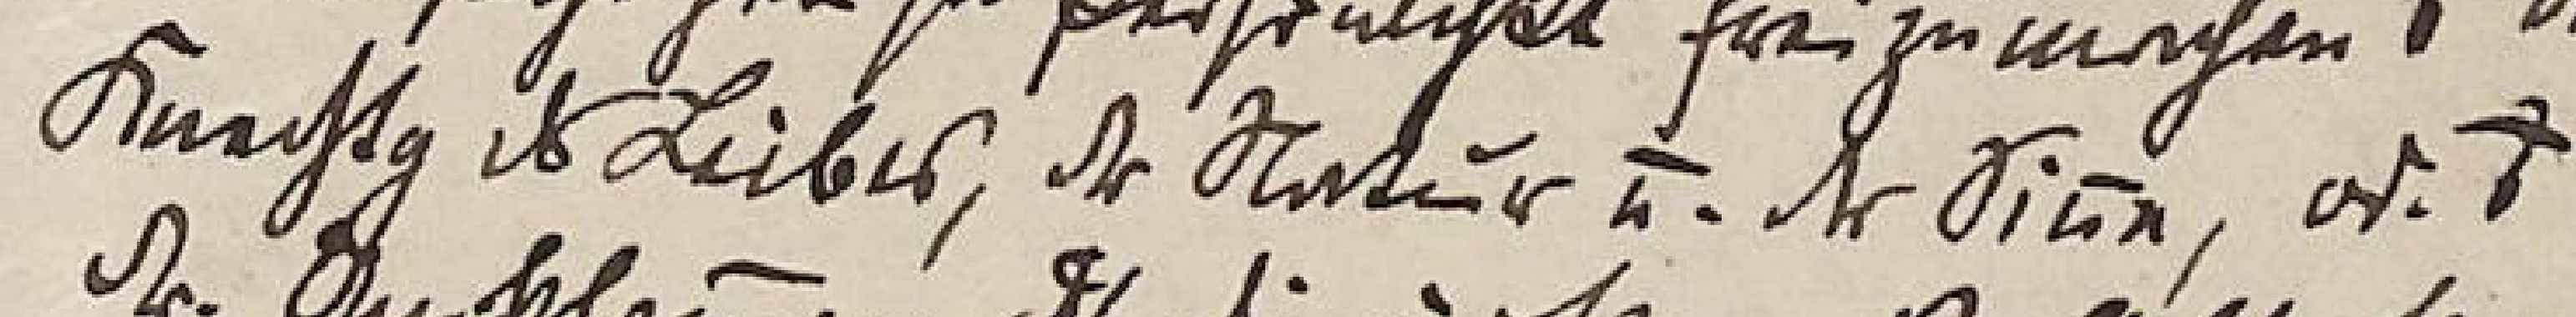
Knechtg ds Leibes, der NAtur u. der Sine, od s
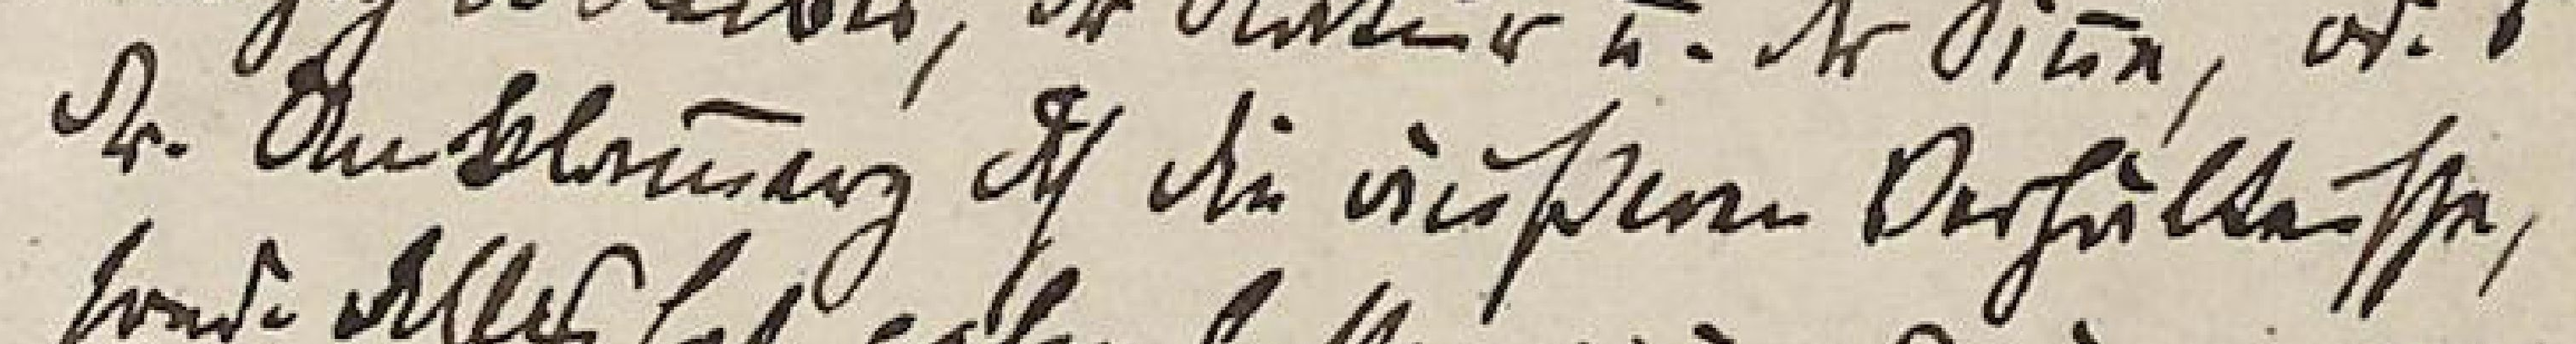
dr Umklamerg dch die äußeren Verhältnisse,
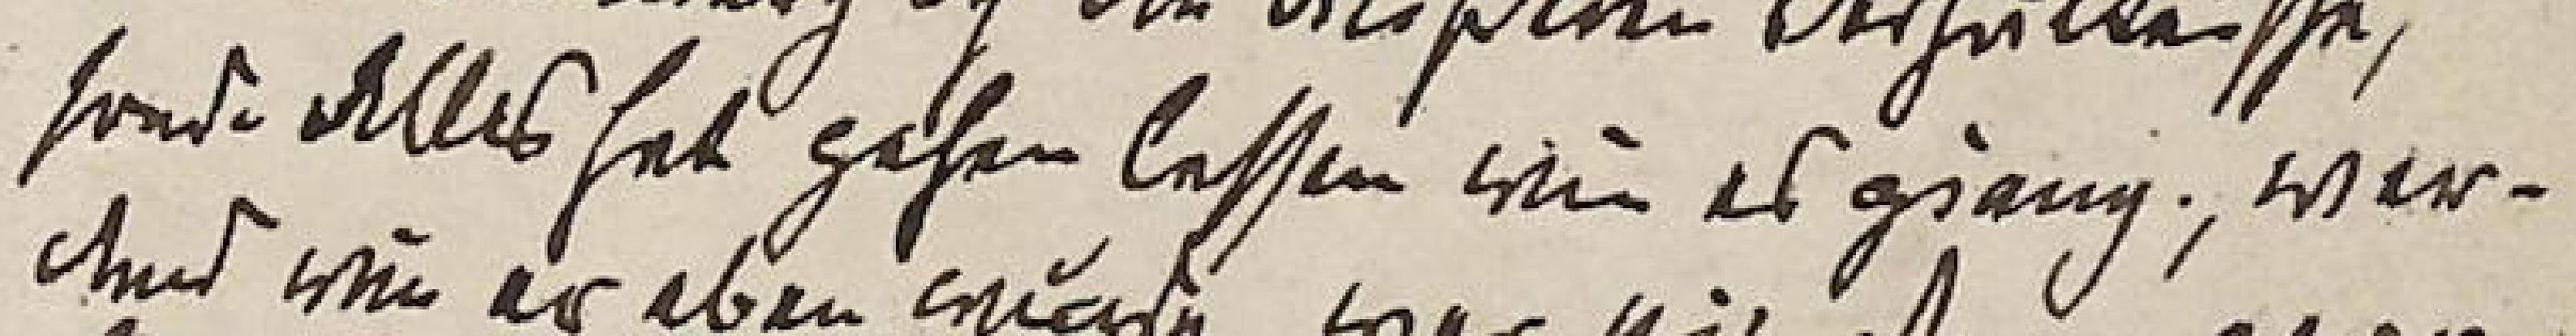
sond. alles hat gehen lassen wie es gieng; wer¬
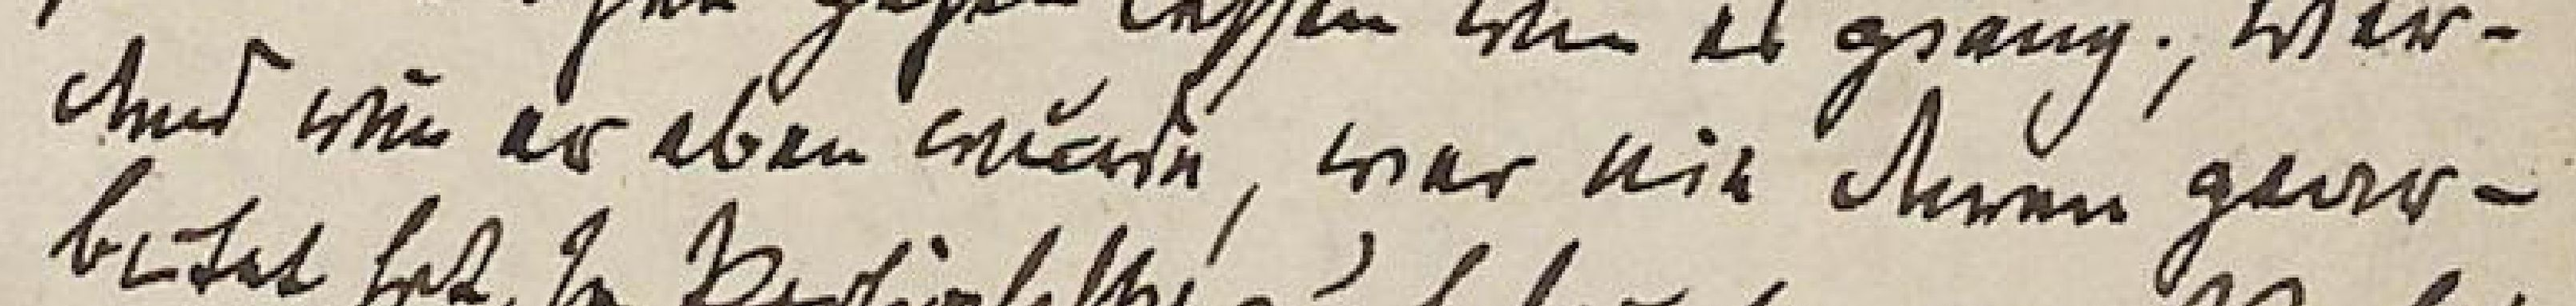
den wie es eben wurde, wer nie daran gear¬
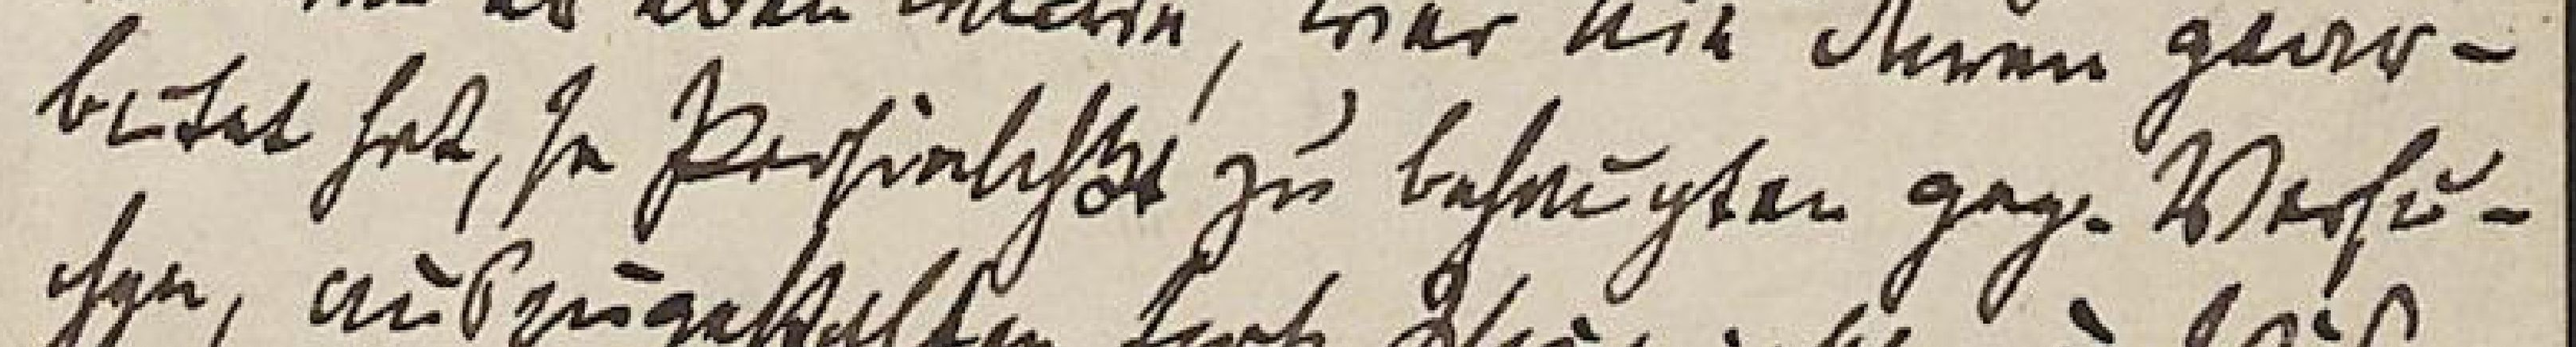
beitet hat, sn Persönlichkt zu behaupten geg. Versu¬
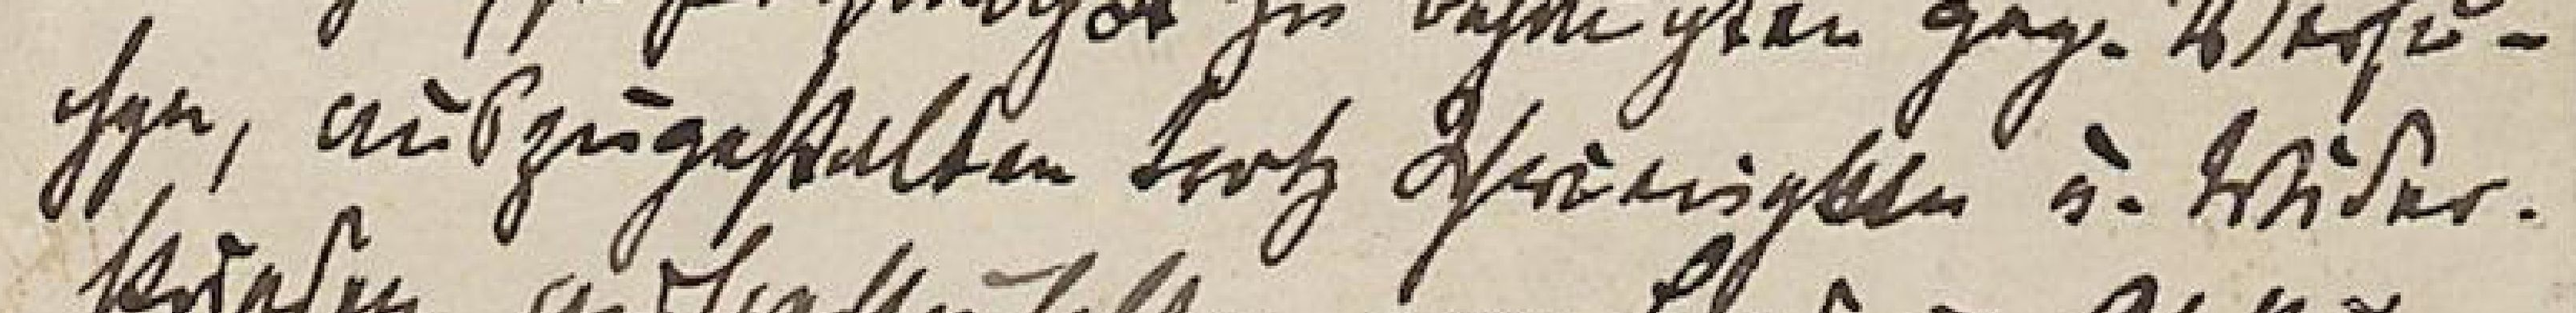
chgn, auszugestalten trotz Schwierigktn u. Wider¬
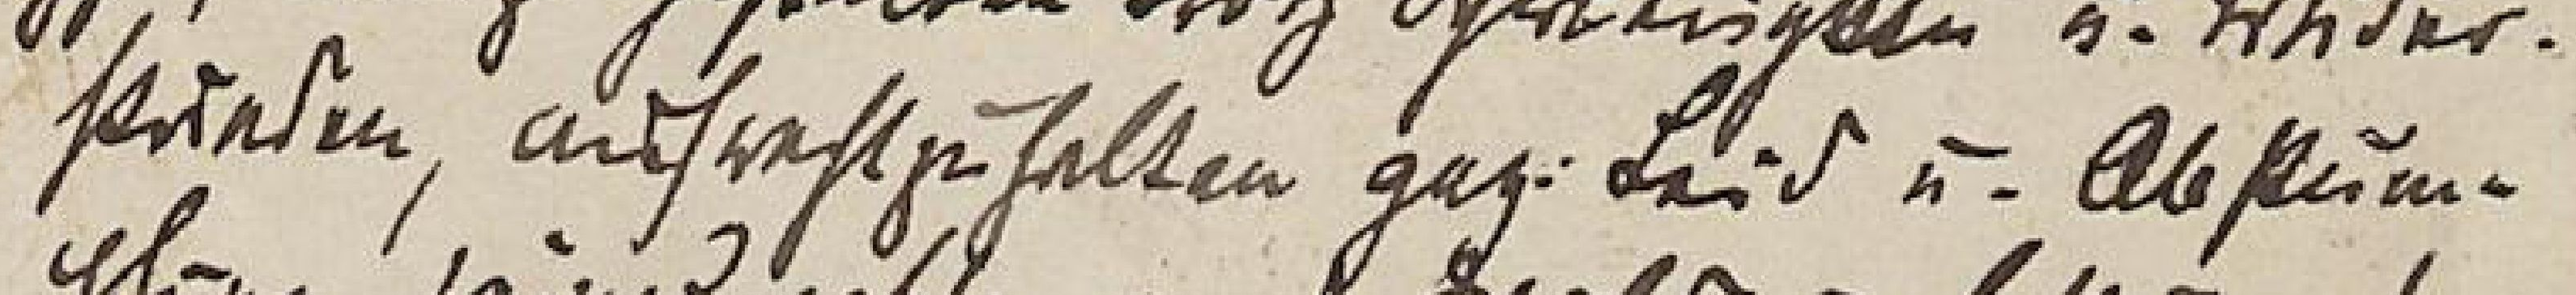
ständen, aufrechtzuhalten geg. Leid u. Abstum¬
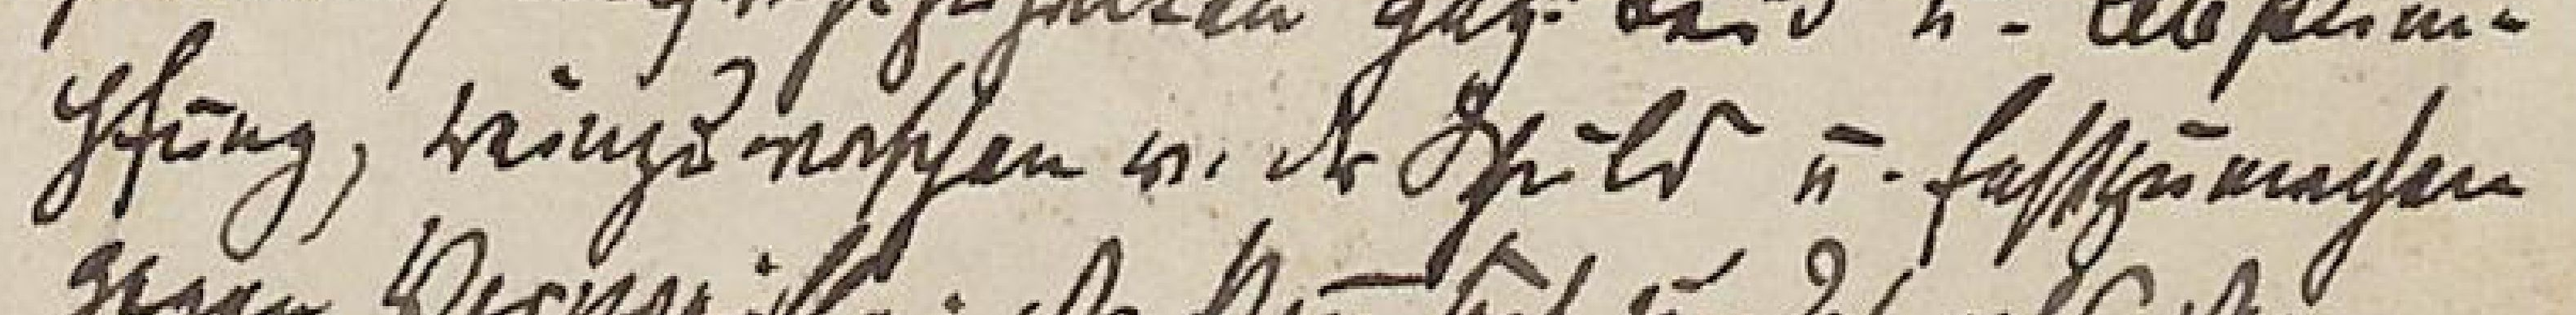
pfung, reinzuwaschen v. dr. Schuld u. festzumachen
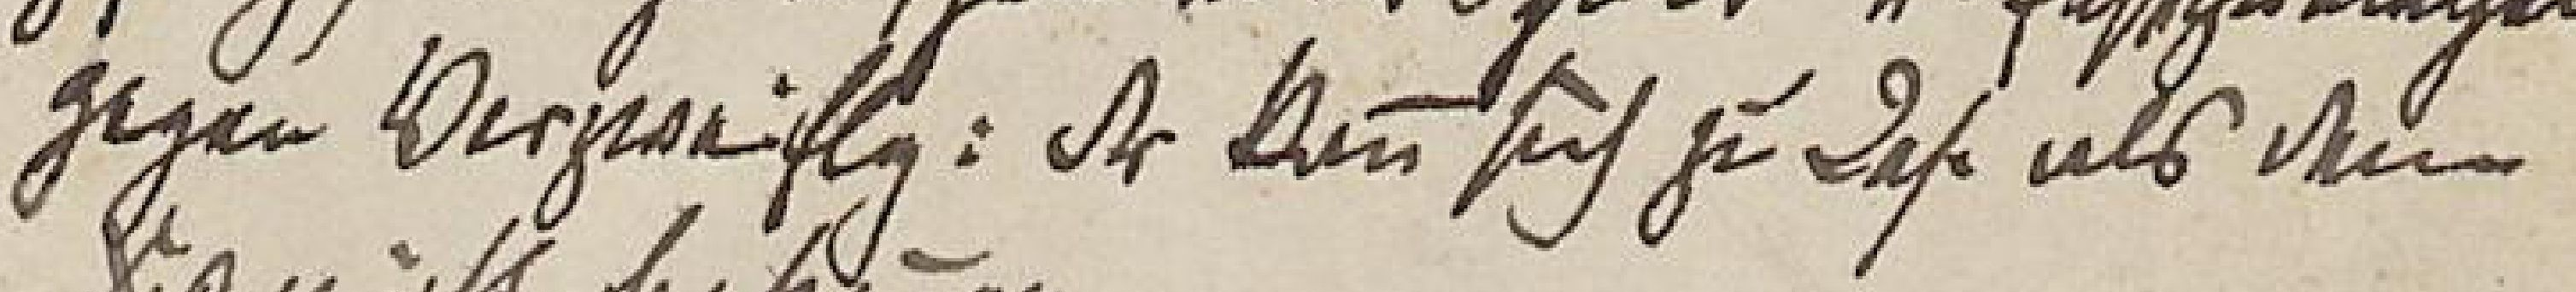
gegen Verzweiflg: dr kan sich zu Jes. als den
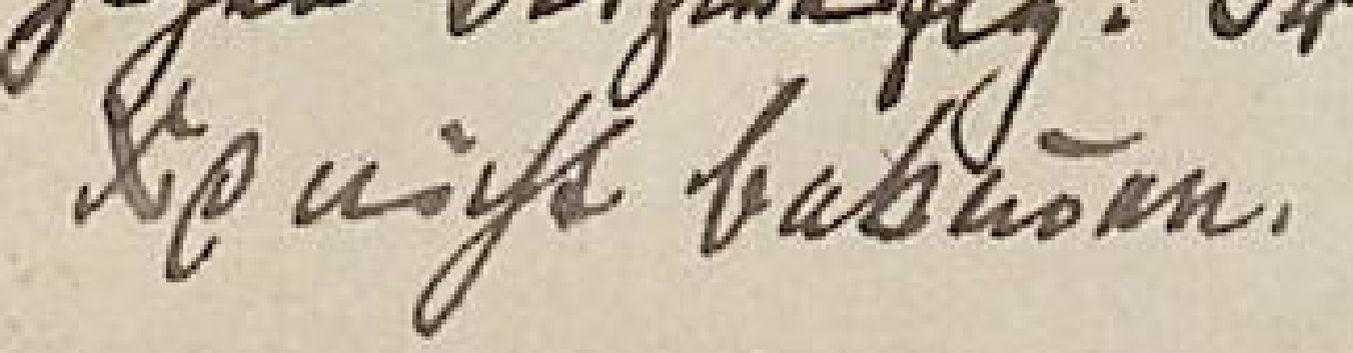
Χρ nicht bekenen.
